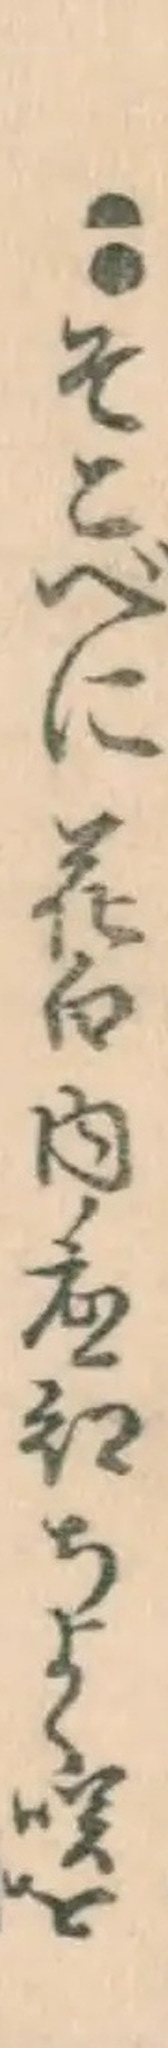●そこべに花白内の底紅よく咲くを
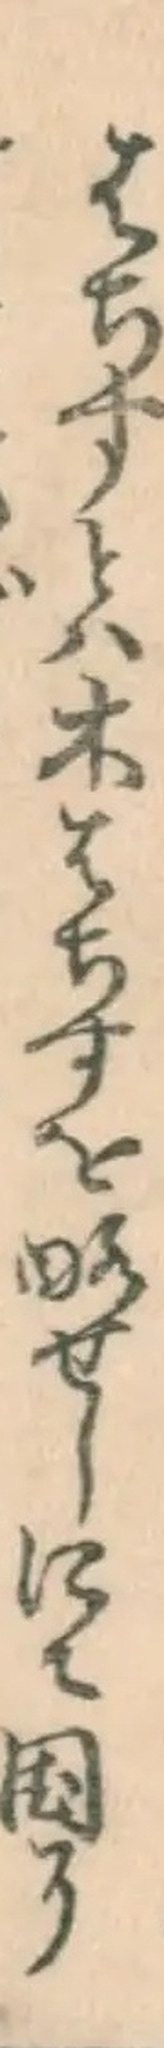はちすとハ木はちすを略せしにて国に
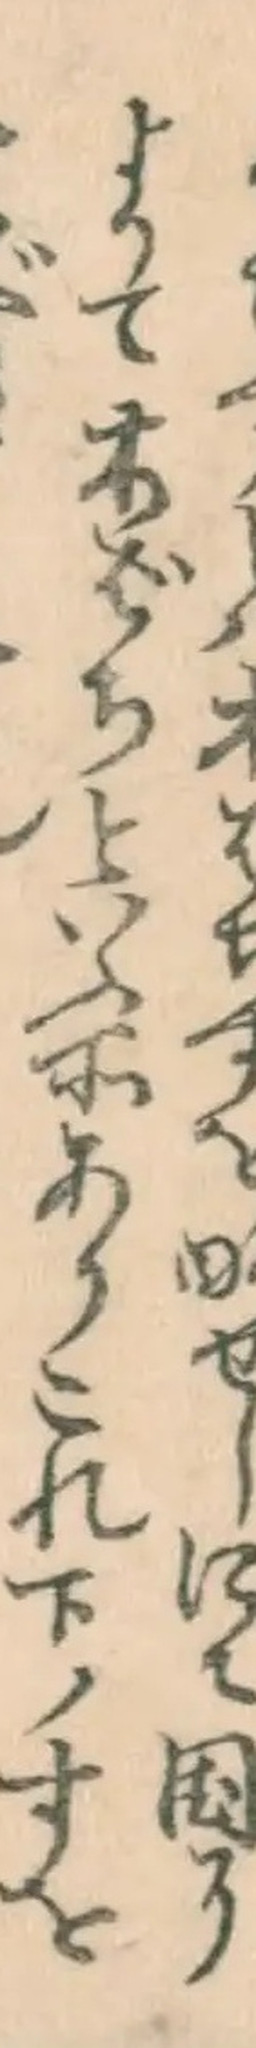よりて木ばち上葉ありこれ下のすを
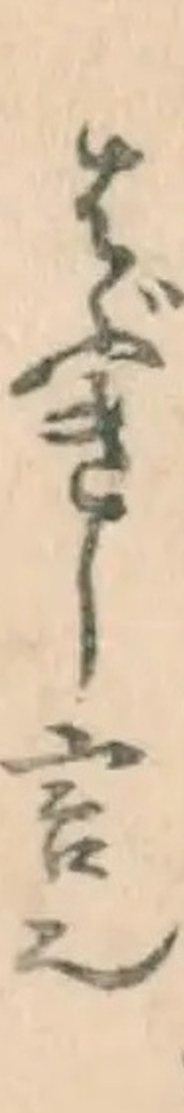はぶきし言う
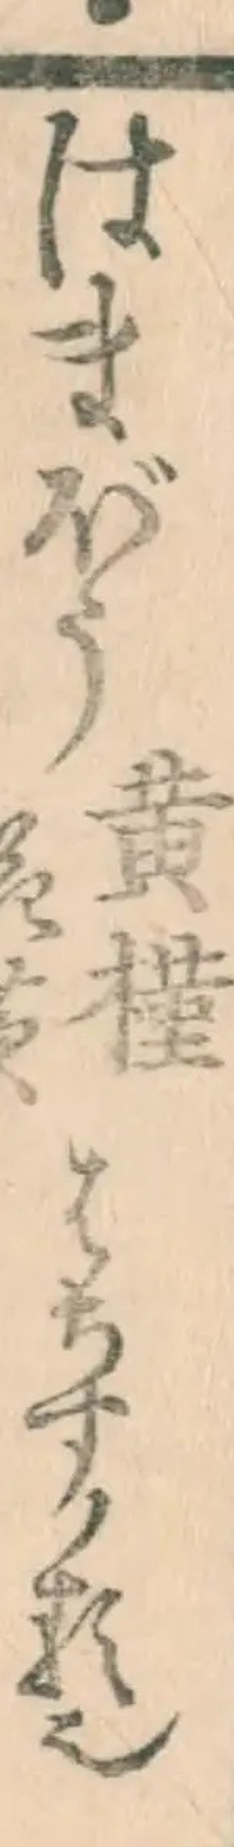はまぼう黄槿はちすの類也
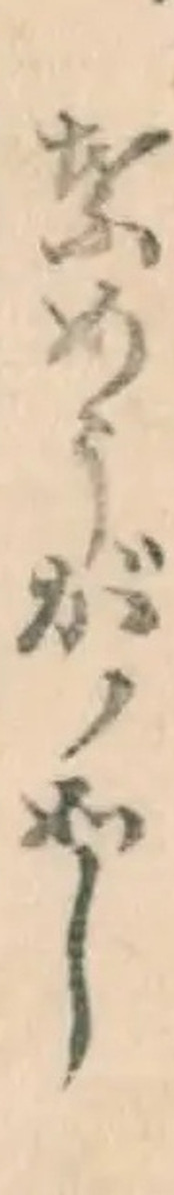葉めうがの如し
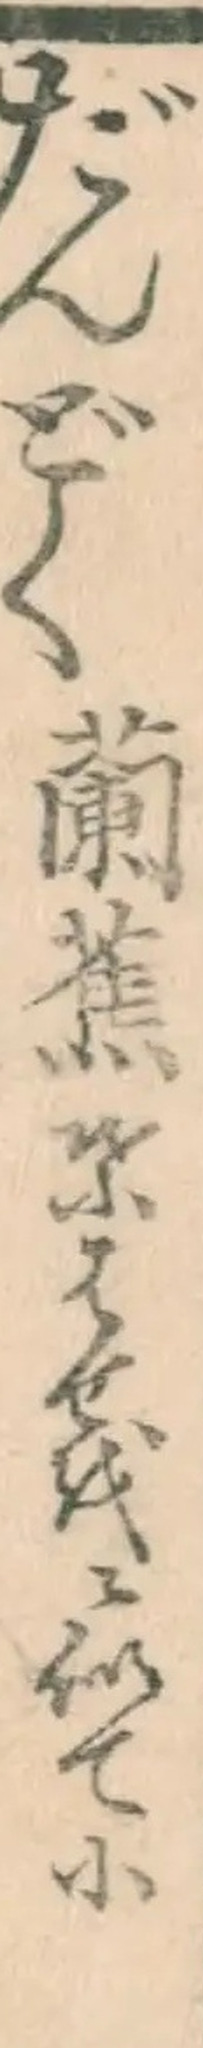だんどく蘭蕉はせを似て小
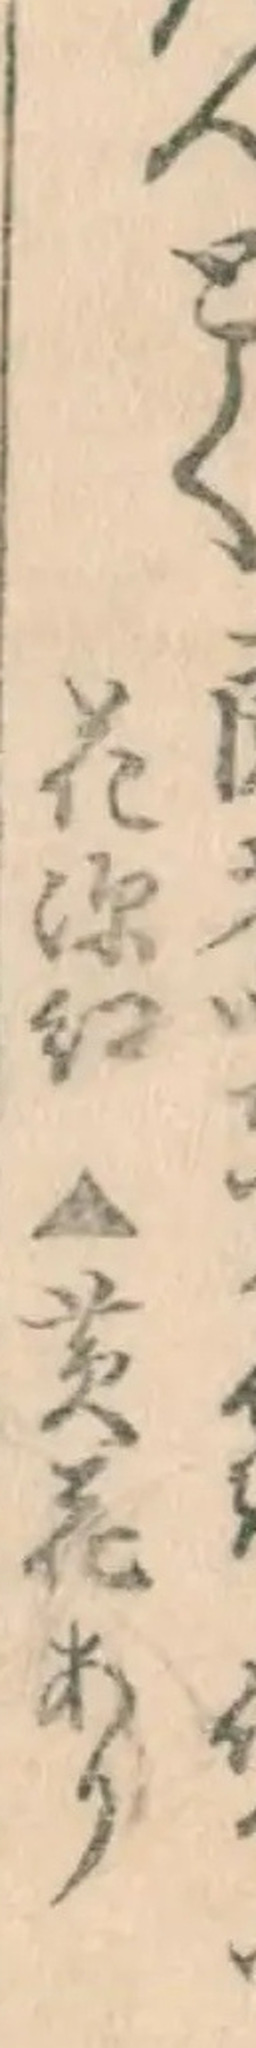花深紅▲黄花あり
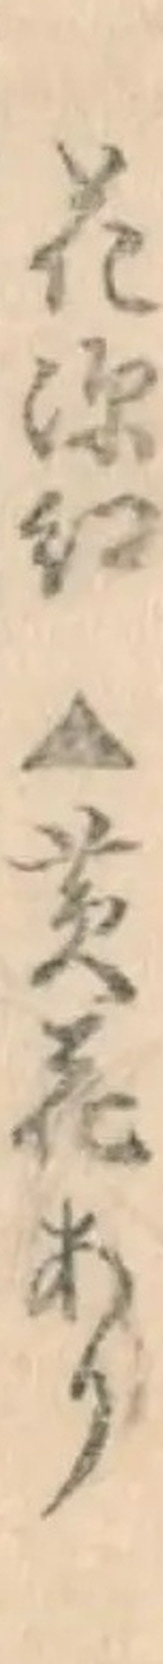花深紅▲黄花あり
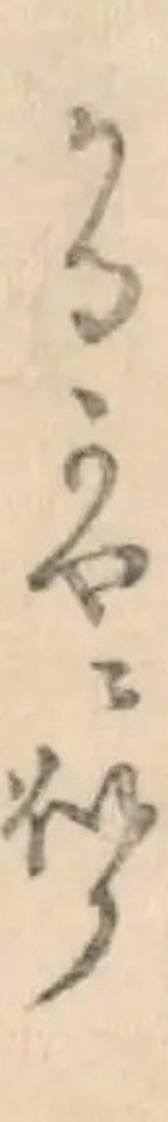かるかやに似り
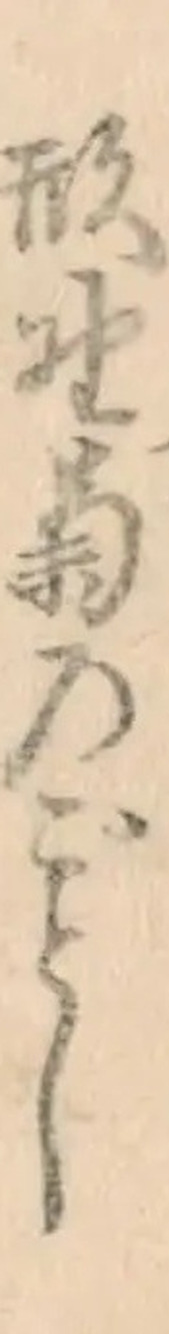形菊のごとし
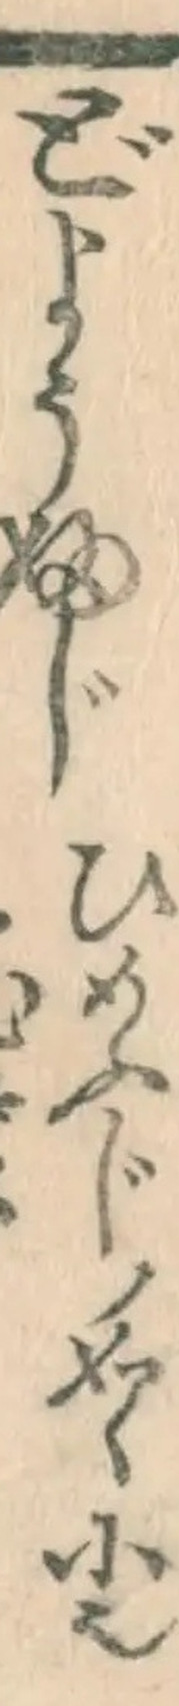どようふじひめふノ如く小也

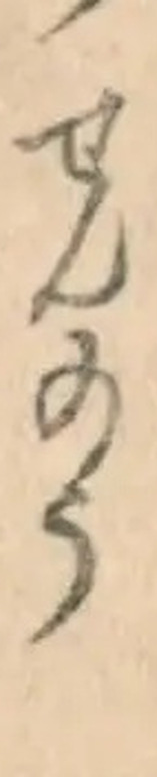せんのう
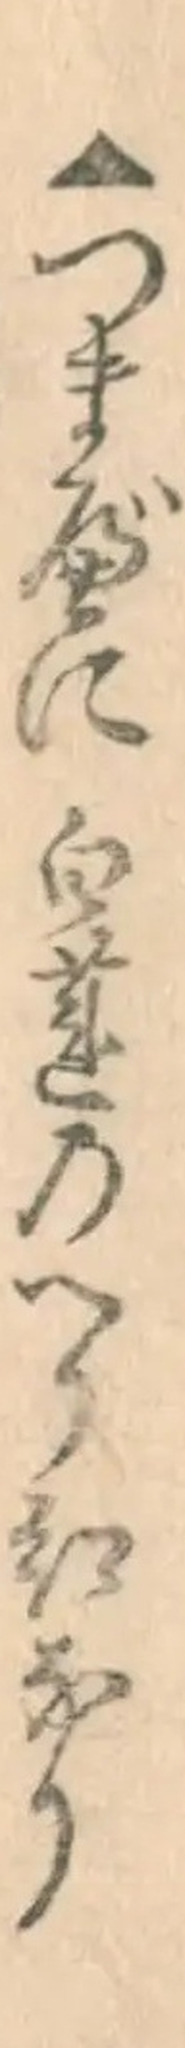▲つまべに白蓮のへり紅なり共
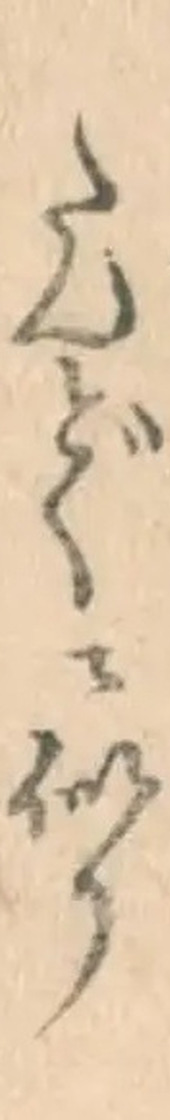たんどくに似り
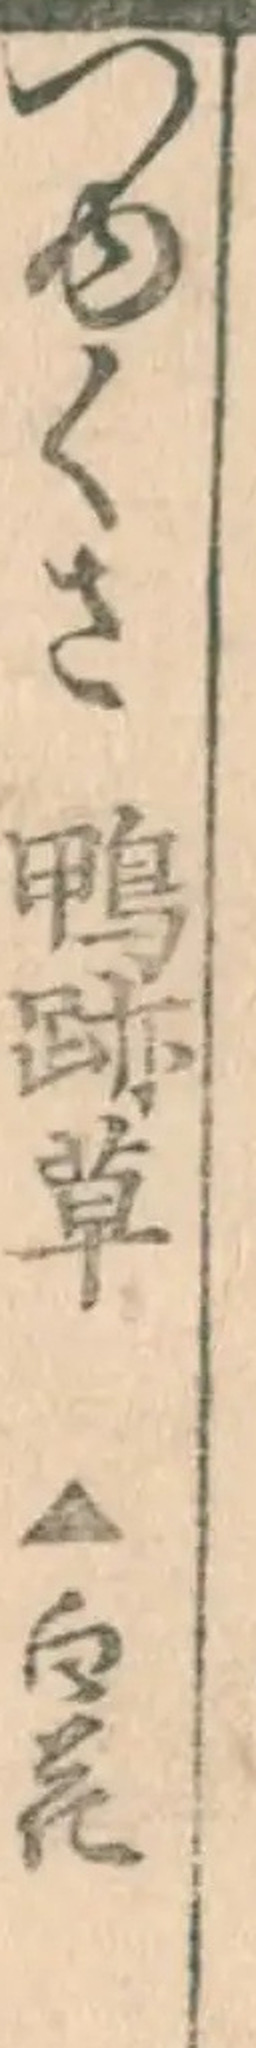つゆくさ鴨跡草▲白花
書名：茶席挿花集
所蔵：国立国会図書館 National Diet Library, JAPAN
